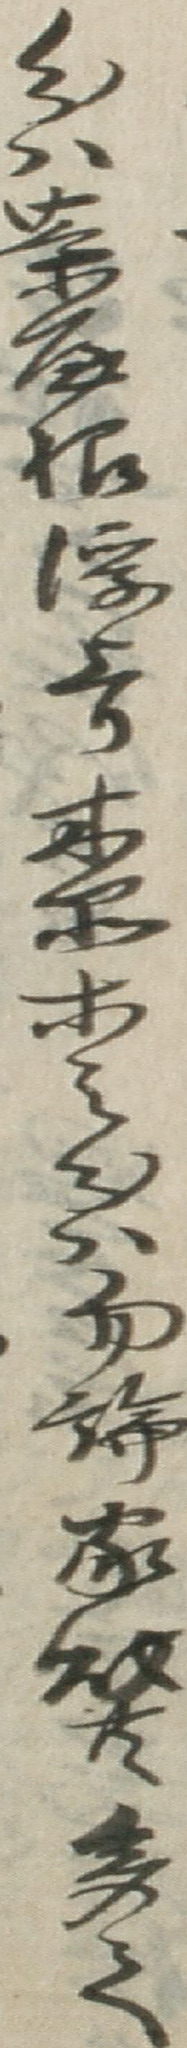分ハ藁屋根浮上り木品等之分ハ勿論家財共多く
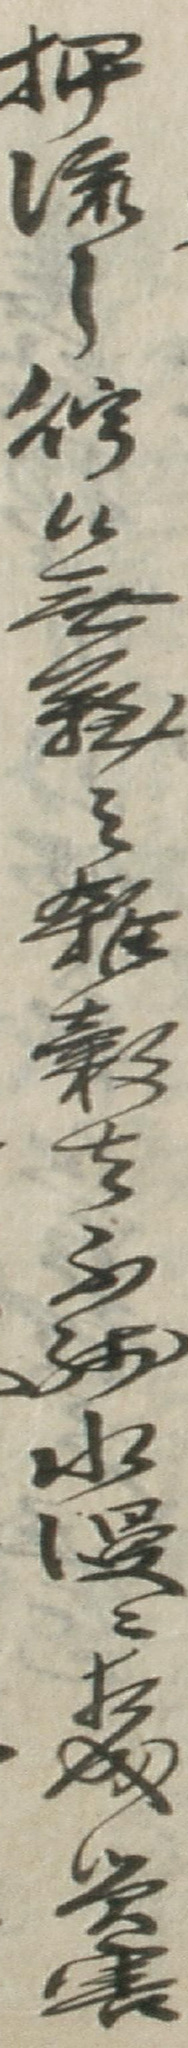押流し貯候無難之雑穀は不残水浸二相成災害
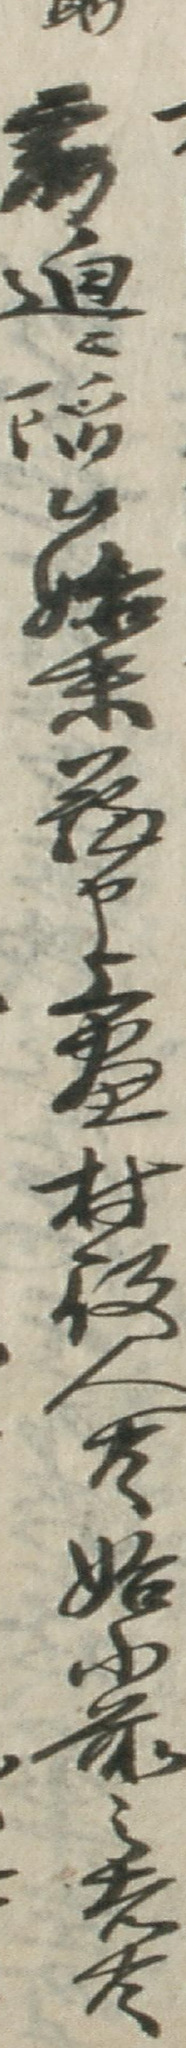窮迫二陥候始末難申上当村役人共始小前之者共
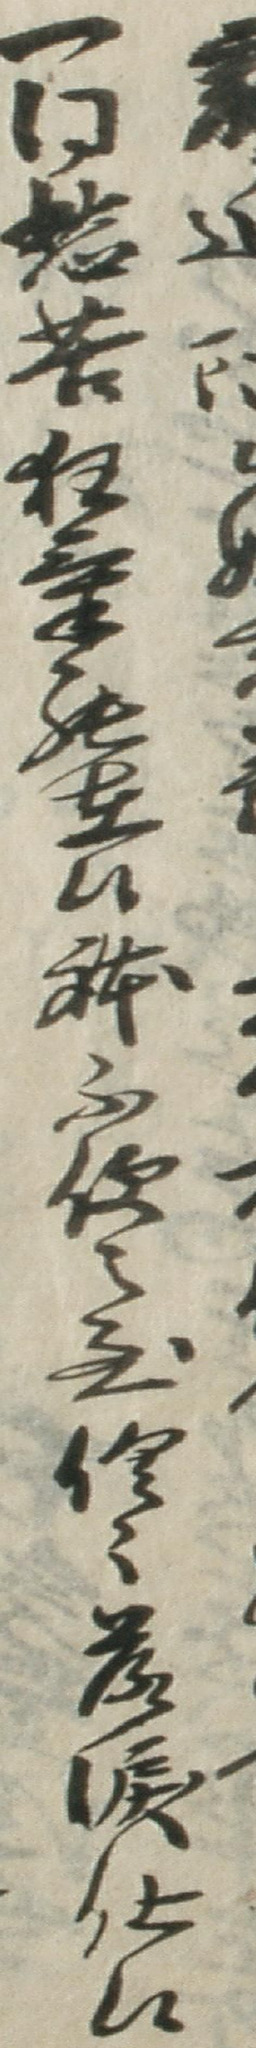一同愁苦狂気罷在候躰不便之至侭々落涙仕候
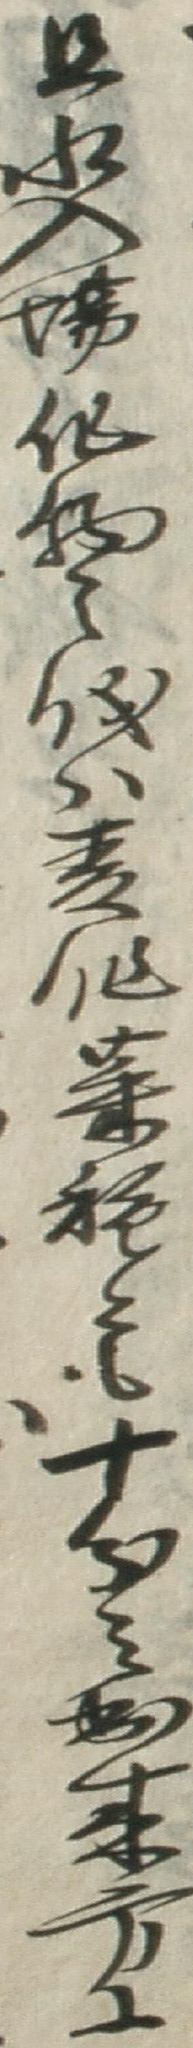且水入場作物之儀ハ麦作菜種とも十分之出来方に
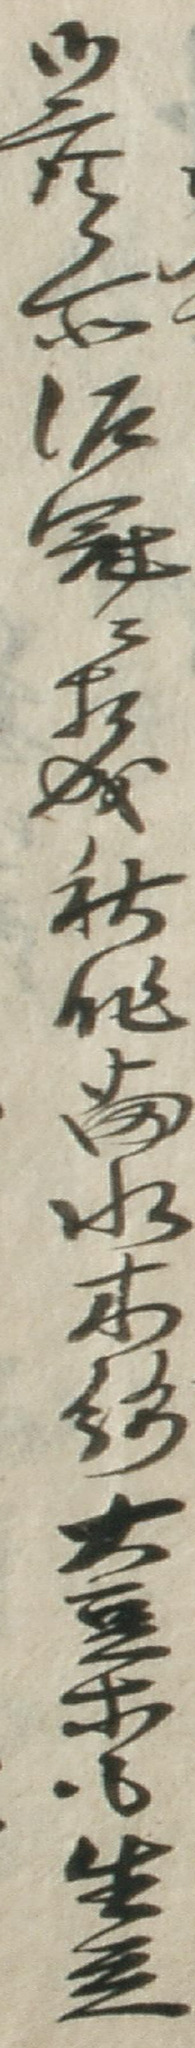御座候所泥冠二相成秋作苗水木綿大豆等も生立
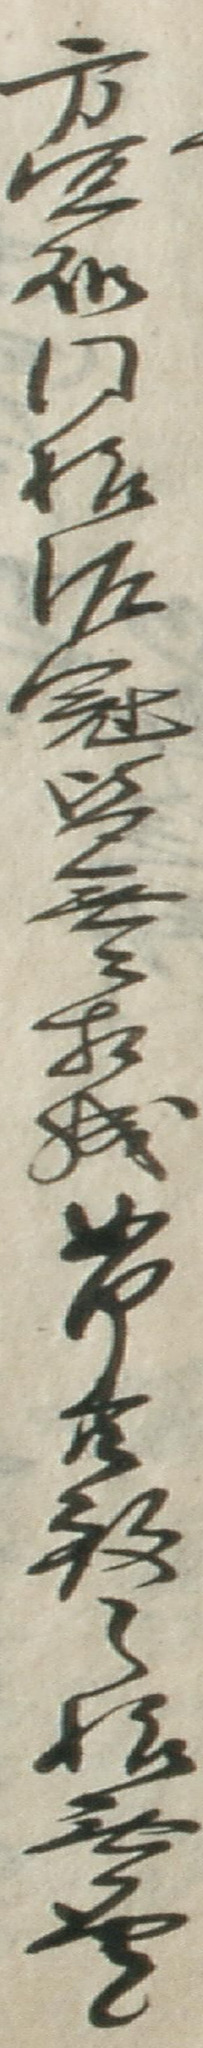宜処同様泥冠皆無二相残如何共致し様無御座候
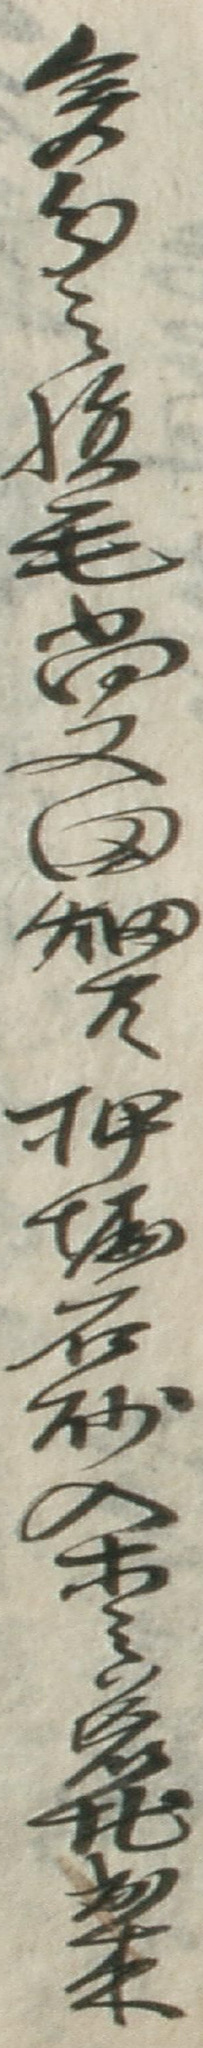多分之損毛尚又田畑共押堀石砂入等之荒地出来
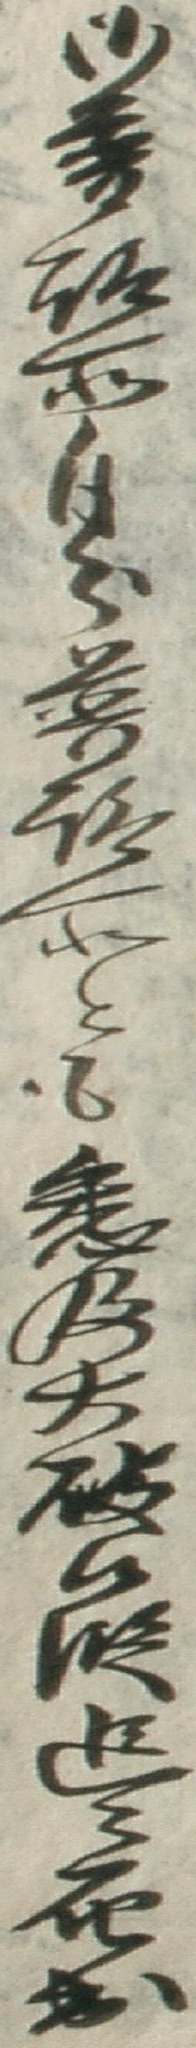御普請所自分普請所とも悉及大破候段追々届出
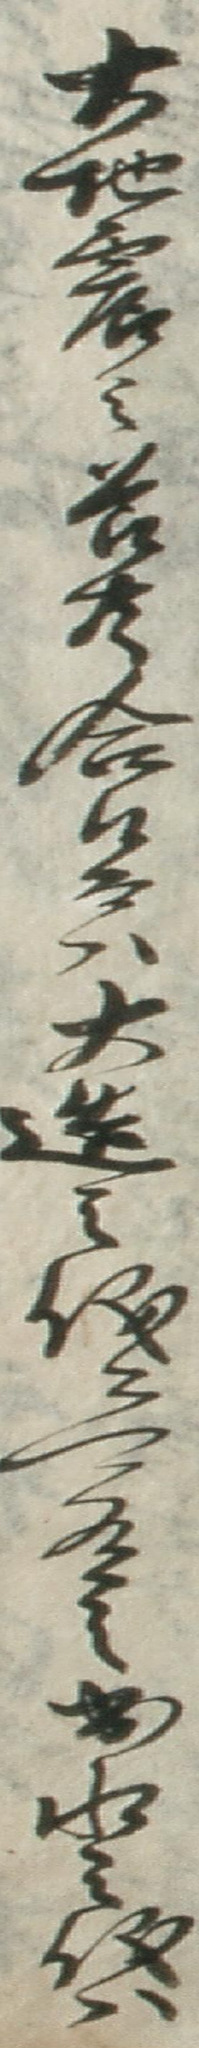大地震之節共合候而ハ大造之儀二可有之出水之儀ハ
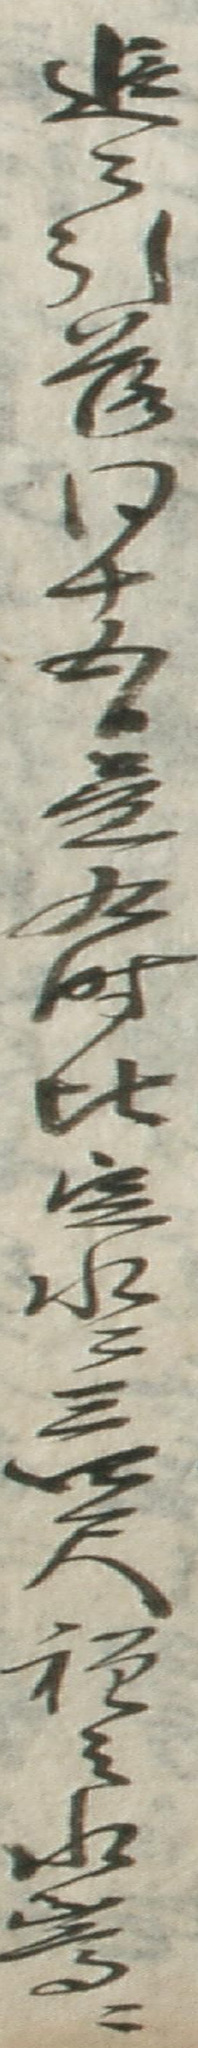追々引落同十五日昼九時比定水二三四尺程之水嵩二
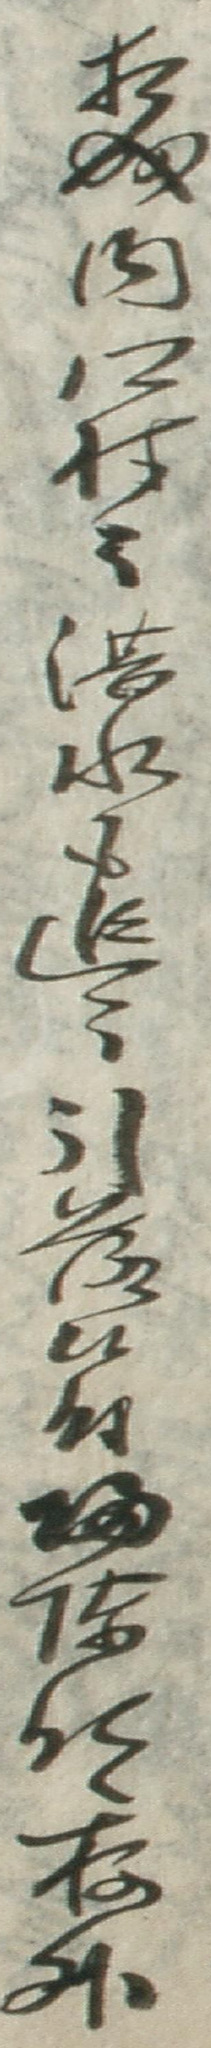相成内郷村々湛水も追々引落候付帰陣仕候存外

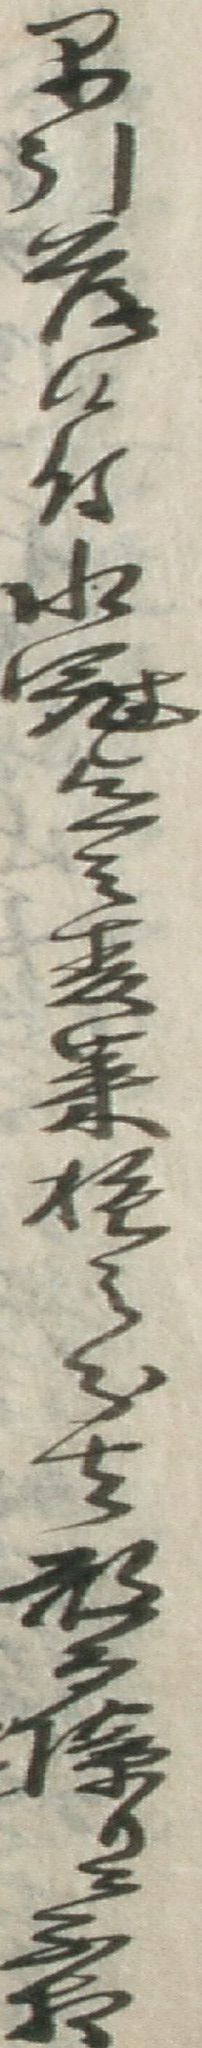早引落候二付水冠追々麦菜種之分ハ敢而障り二不相
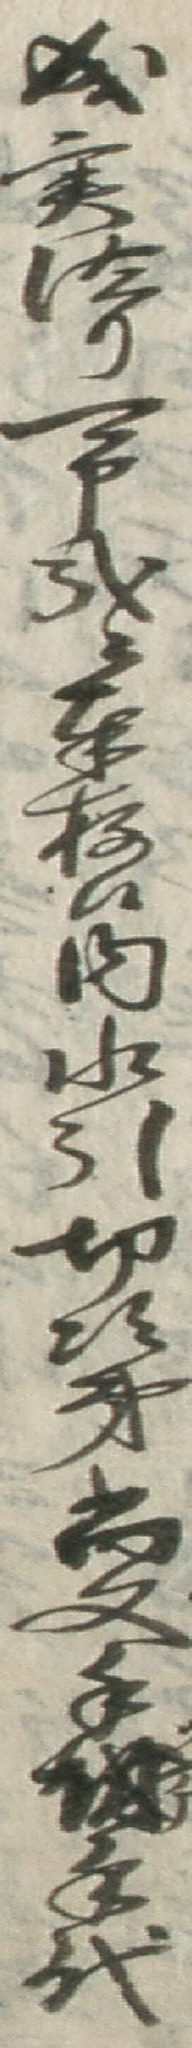成実結可申哉二奉存候内水引切次第尚又手付手代
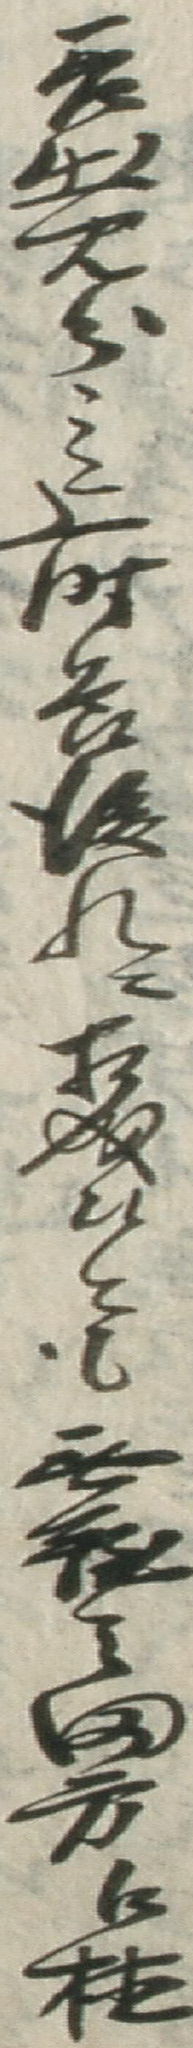差出見分之上時節後れ二相成候とも無難之田方江植
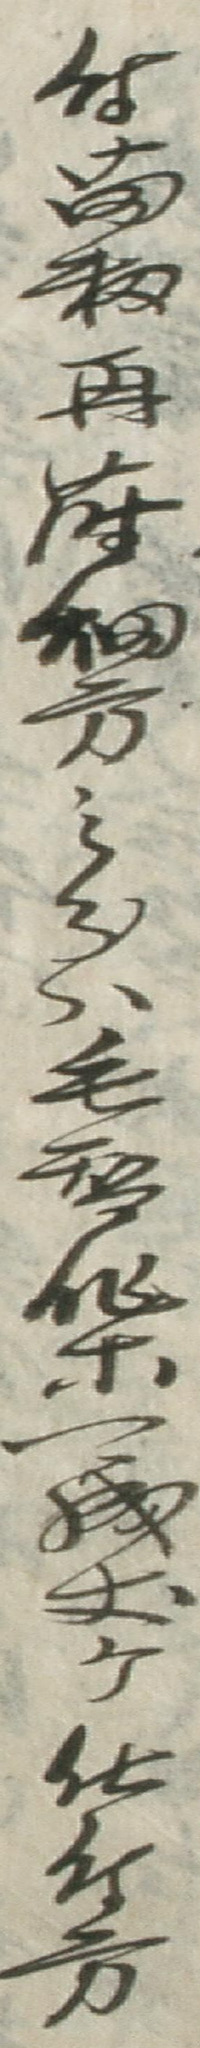付苗籾並蒔畑方之分ハもち作等可相成丈ヶ仕付方
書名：信濃國地震實録記
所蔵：東京大学地震研究所図書室 Earthquake Research Institute Library, The University of Tokyo, JAPAN
